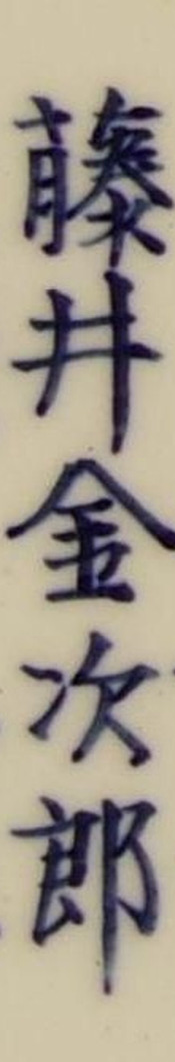藤井金次郎
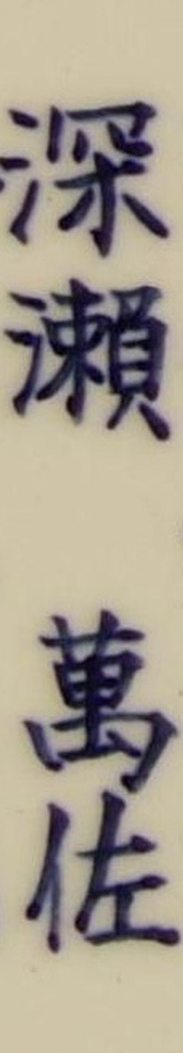深瀬萬佐
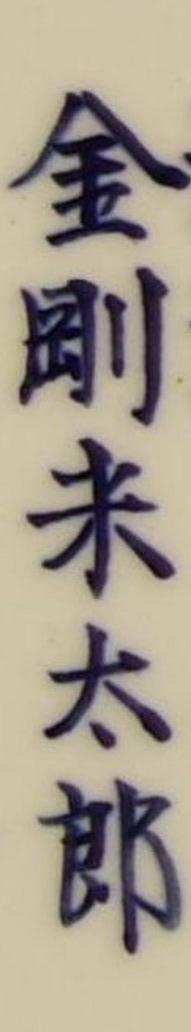金剛米太郎

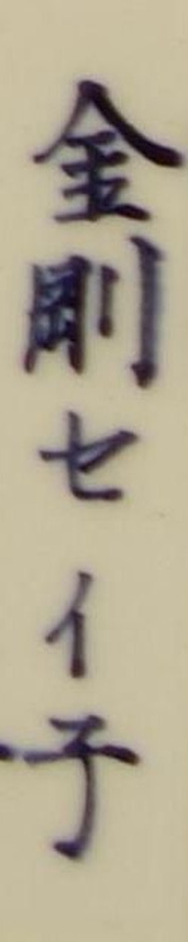金剛セイ子
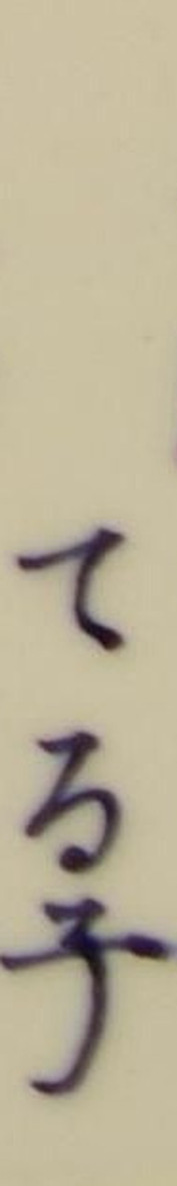てる子
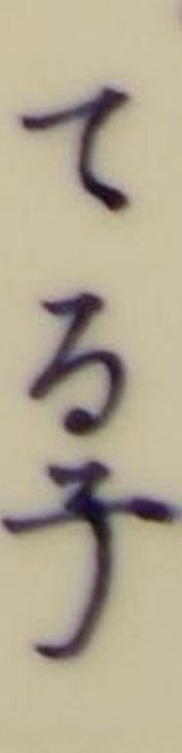てる子
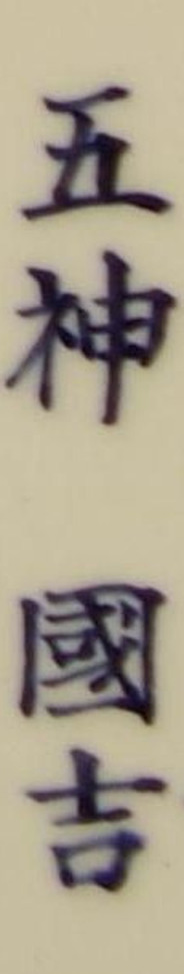五神国吉
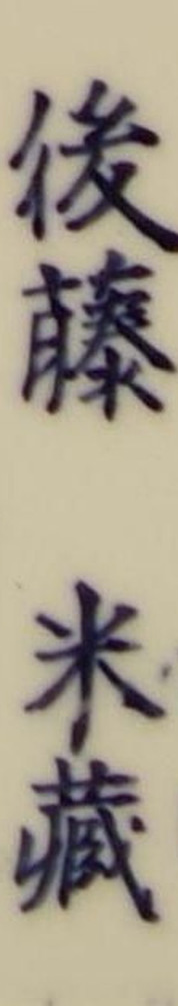後藤米蔵
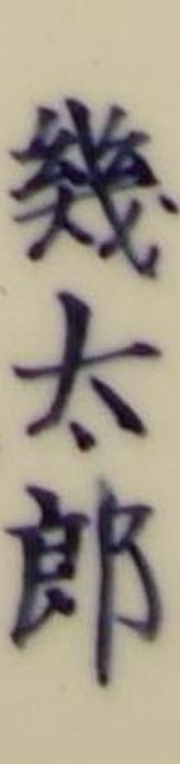幾太郎
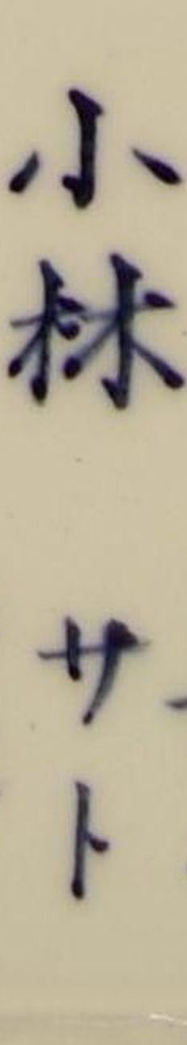小林サト
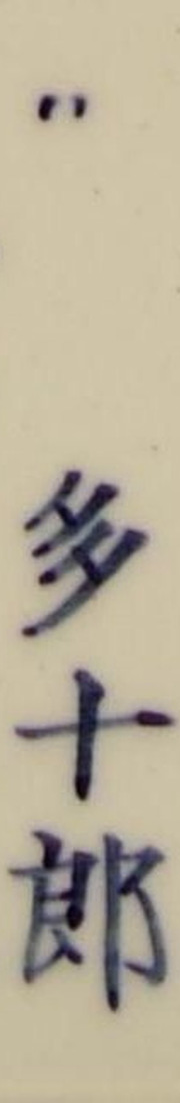多十郎
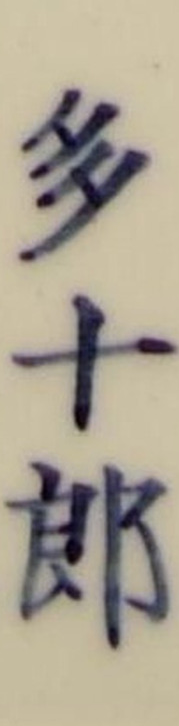多十郎
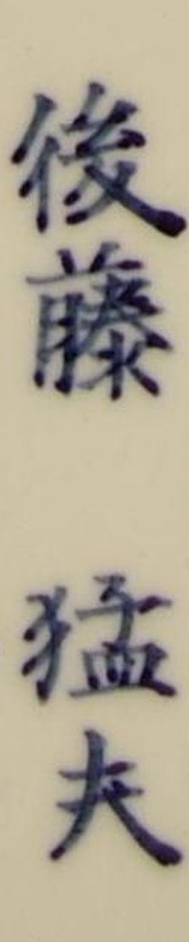後藤猛夫
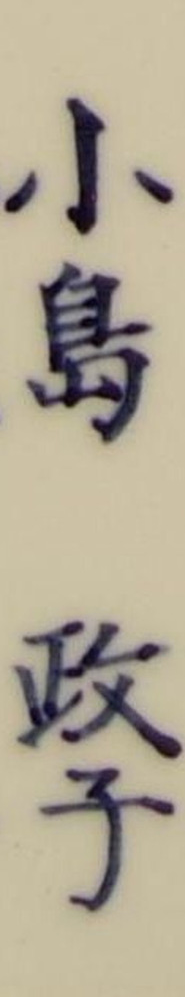小島政子
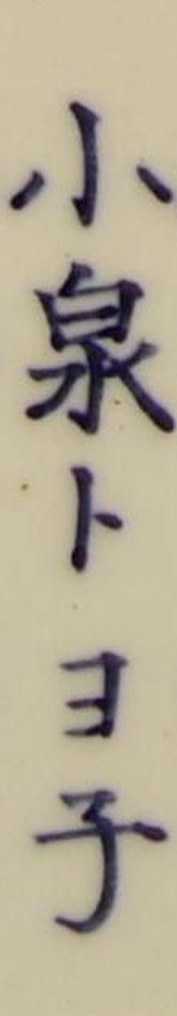小泉トヨ子
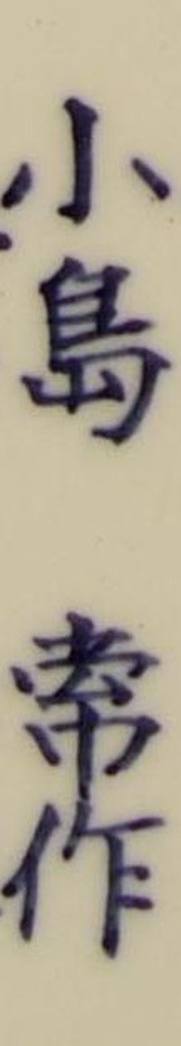小島常作
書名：E~L
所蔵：高野山金剛峯寺
